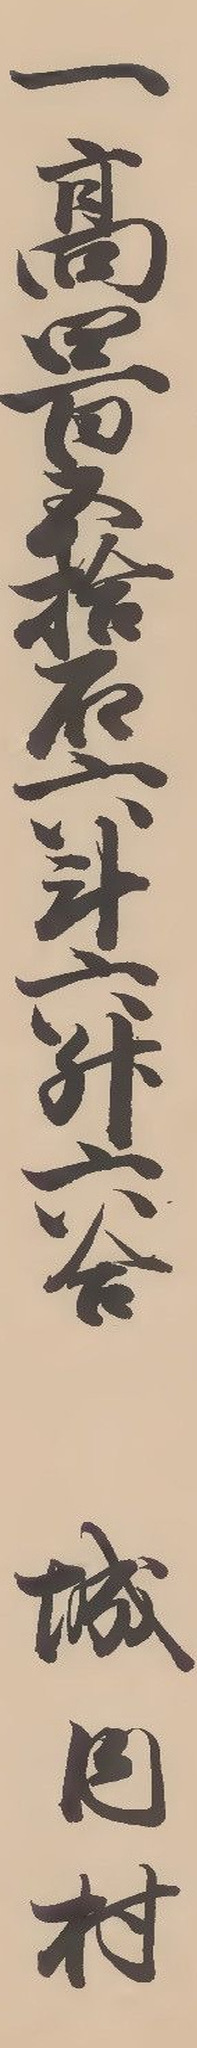一高四百五拾石六斗六升六合城内村
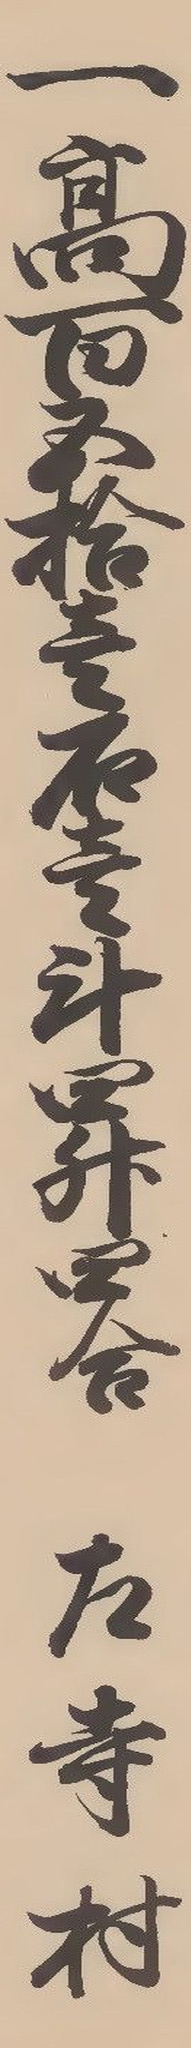一高百五拾壱石壱斗四升四合左寺村
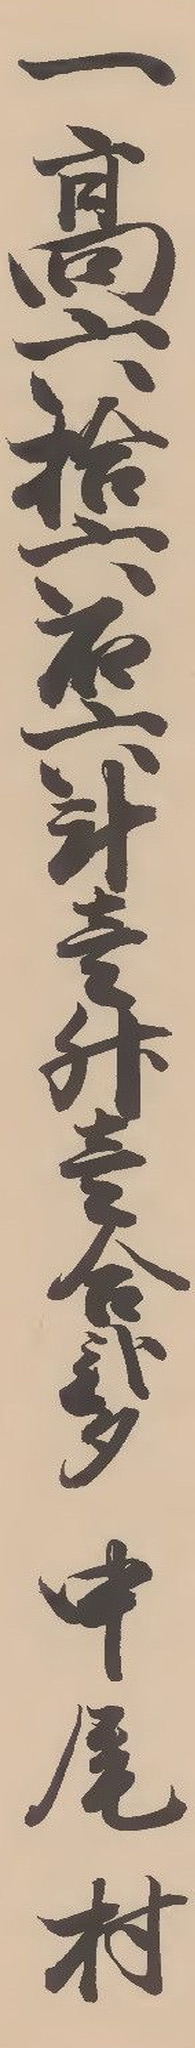一高六拾六石六斗壱升壱合弐勺中尾村

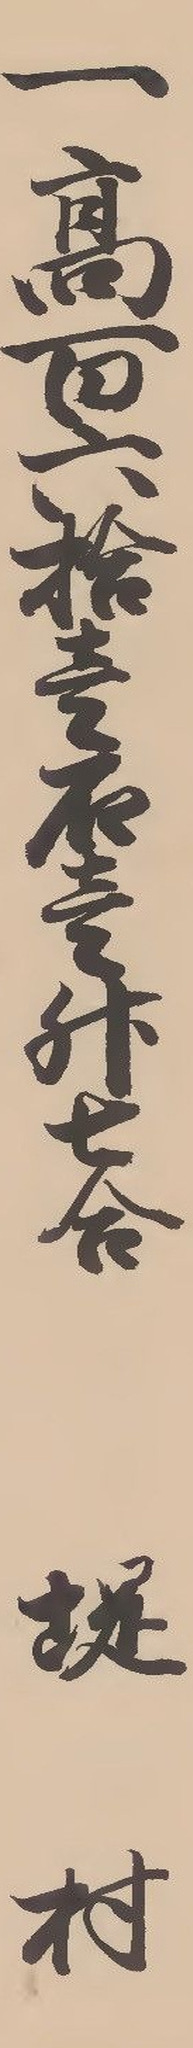一高百六拾壱石壱升七合堤村
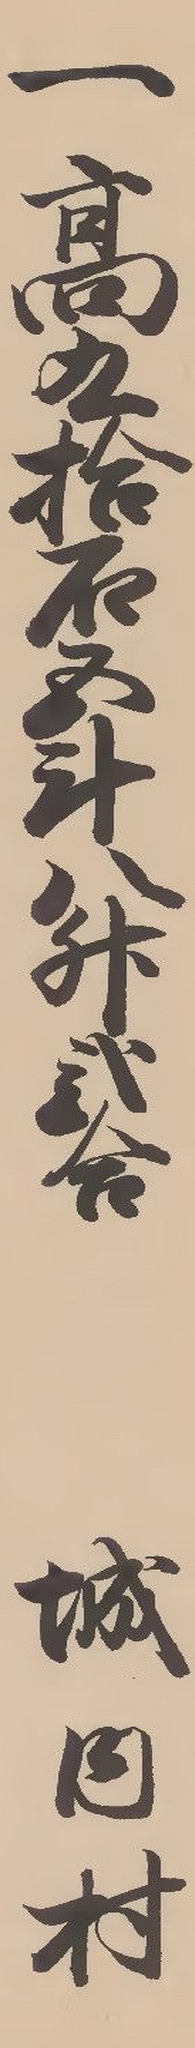一高九拾石五斗八升弐合城内村
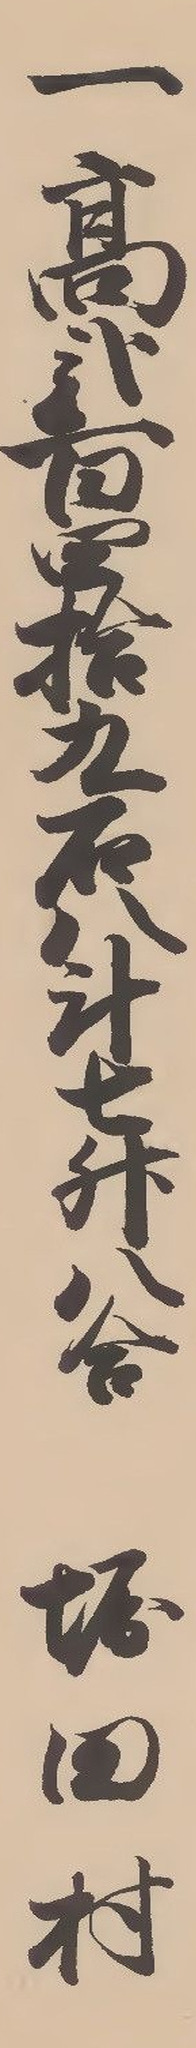一高弐百四拾九石八斗七升八合堀田村
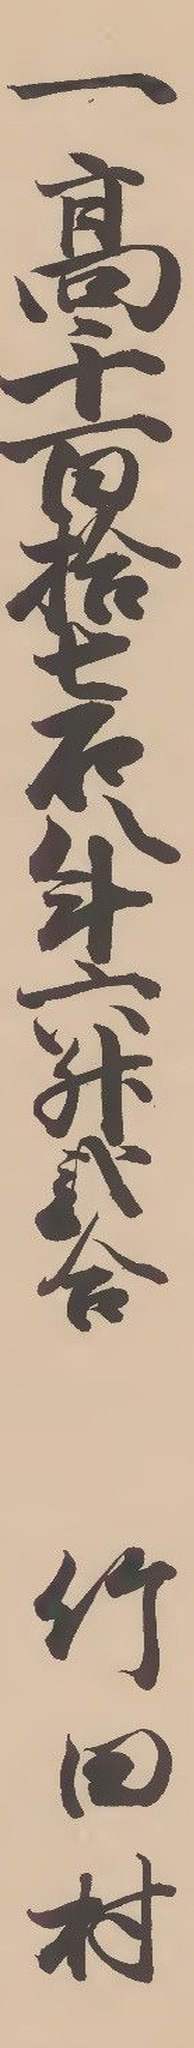一高千百拾七石八斗六升弐合竹田村
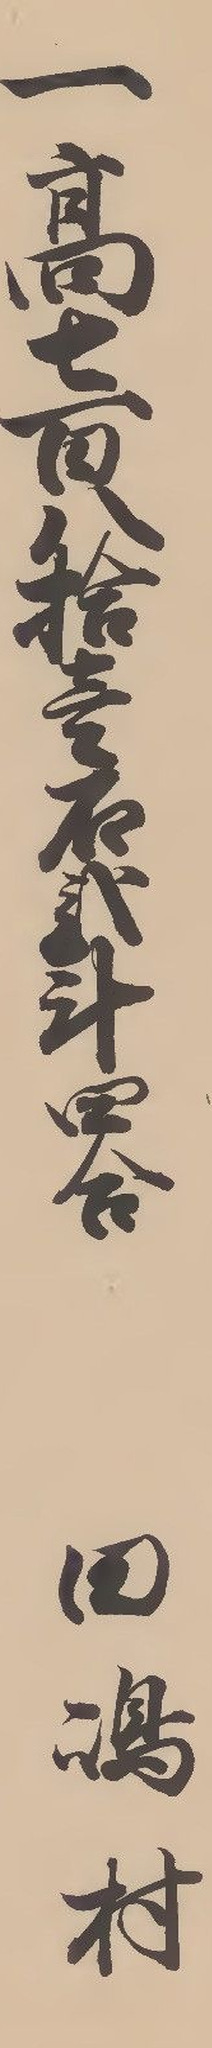一高七百八拾壱石弐斗四合田島村
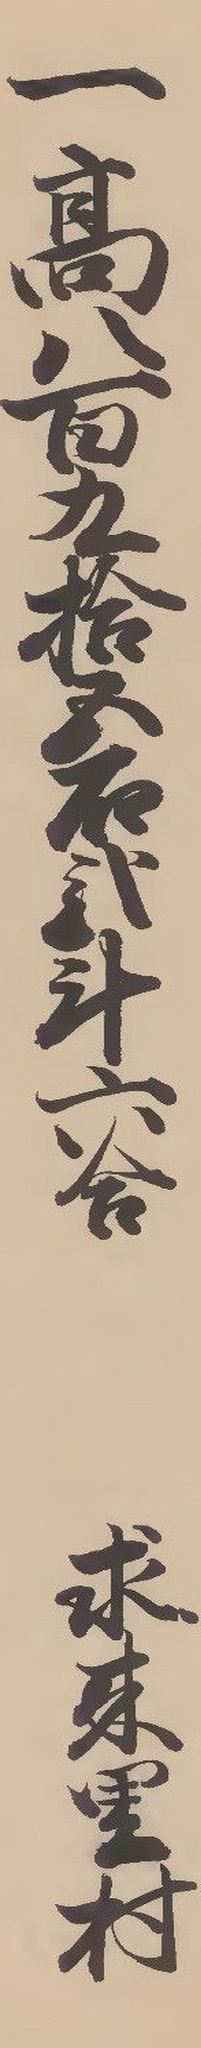一高八百九拾五石弐斗六合求来里村
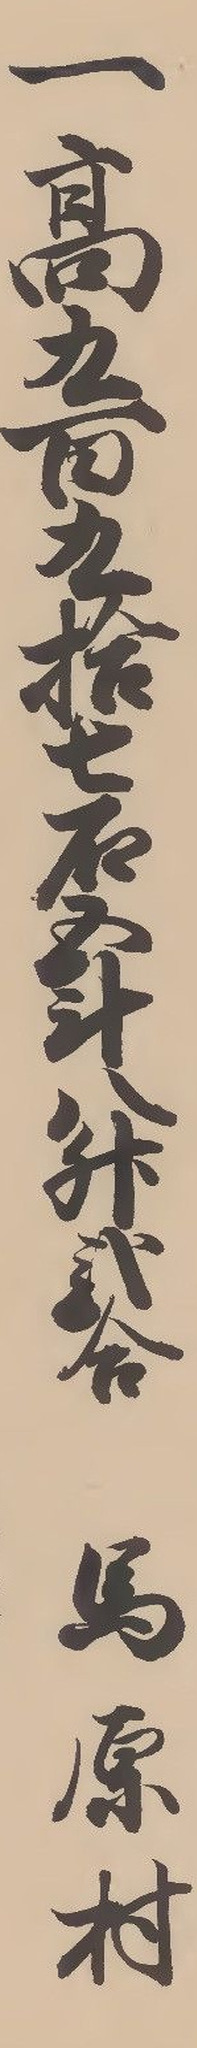一高九百九拾七石五斗八升弐合馬原村

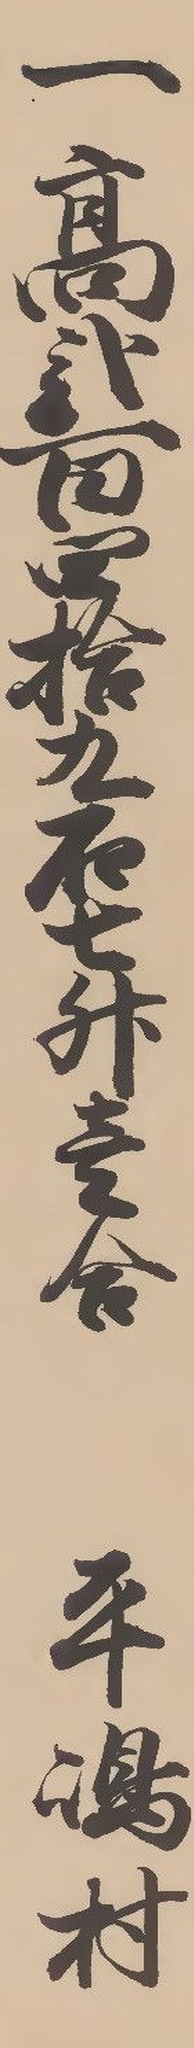一高弐百四拾九石七升壱合平島村
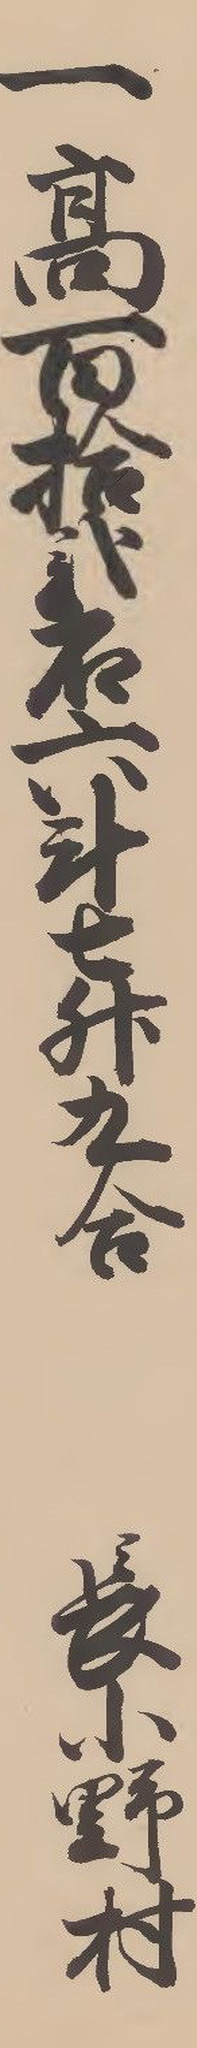一高百拾弐石六斗七升九合長小野村
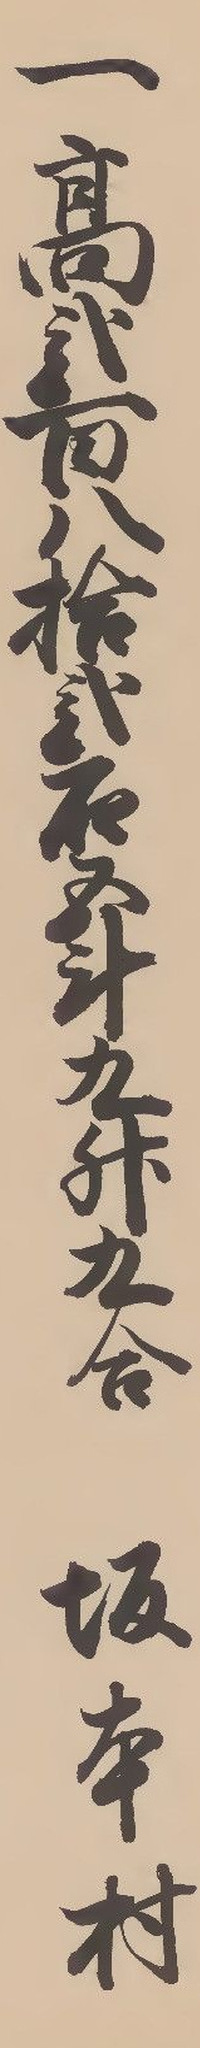一高弐百八拾弐石五斗九升九合坂本村
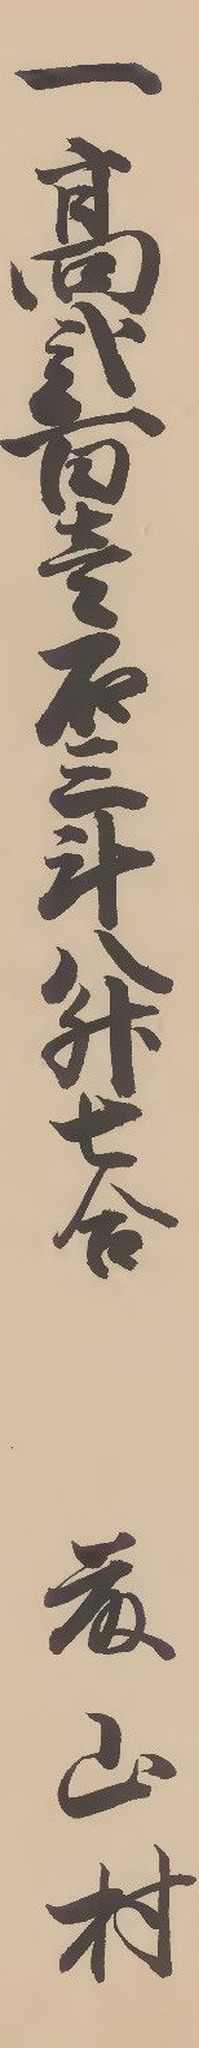一高弐百壱石三斗八升七合藤山村

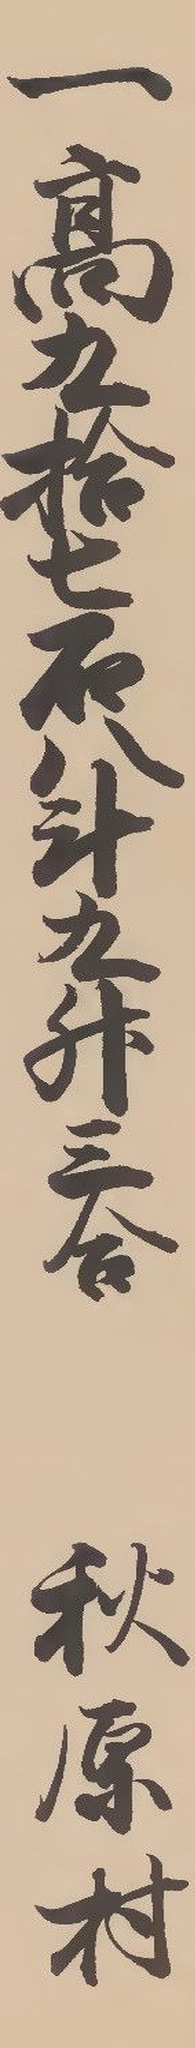一高九拾七石八斗九升三合秋原村
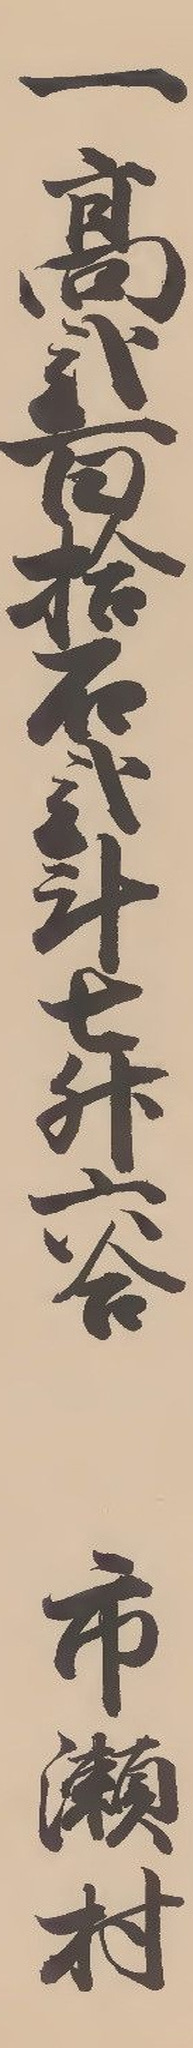一高弐百拾石弐斗七升六合市瀬村
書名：豊後国郷帳
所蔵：国立公文書館 National Archives of Japan
